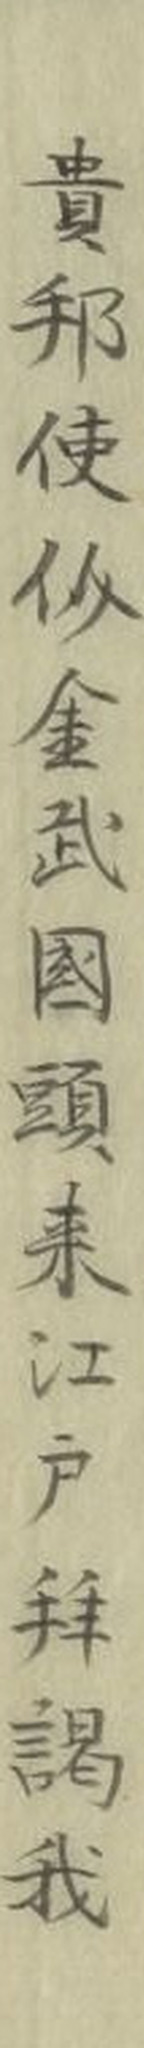貴邦使价金武国頭来江戸拝謁我
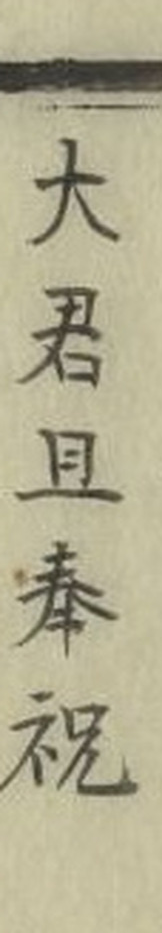大君且奉祝
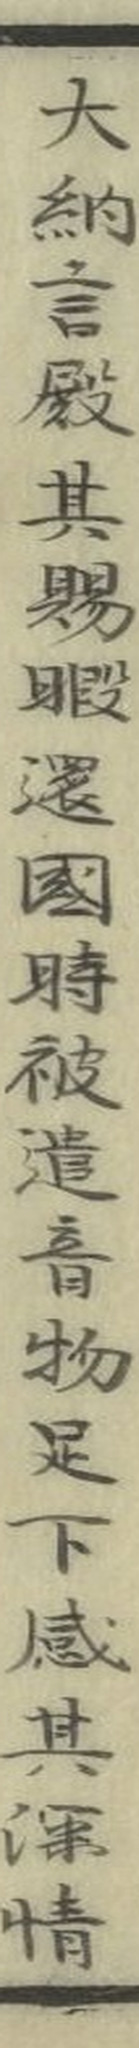大納言殿其賜暇還国時被遣音物足下感其深情
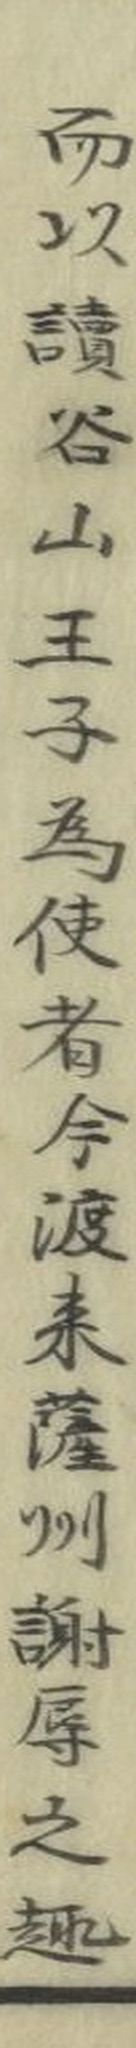而以読谷山王子為使者今渡来薩州謝辱之趣
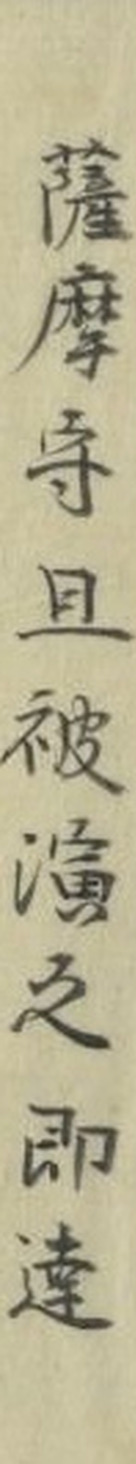薩摩守且被演之即達
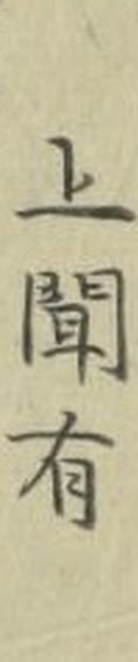上聞有
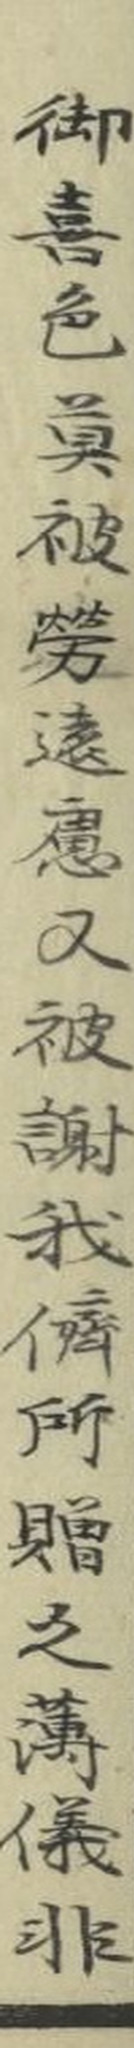御喜色莫被労遠慮又被謝我済所贈之薄儀非
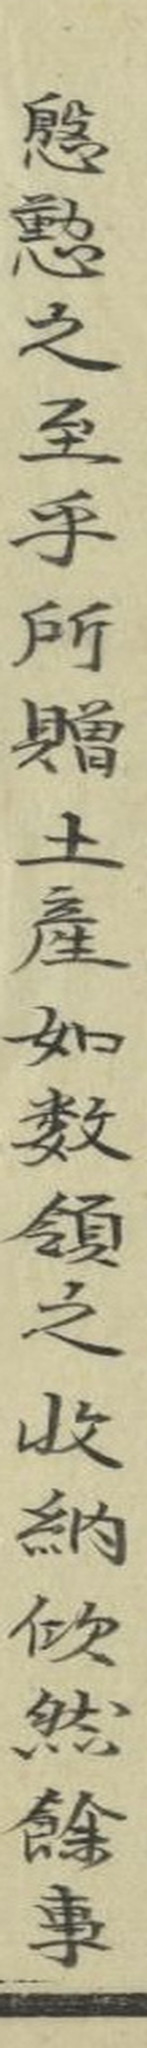慇懃之至乎所贈土産如数領之収納欣然余事
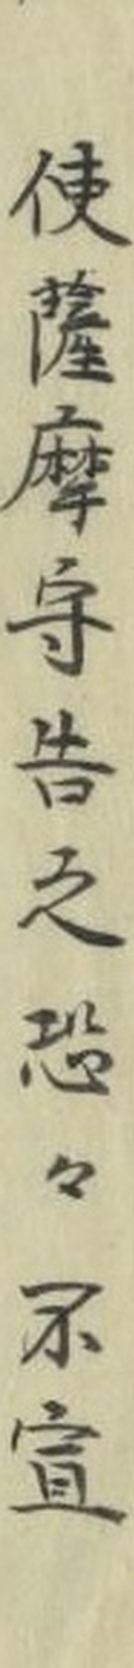使薩摩守告之恐々不宣
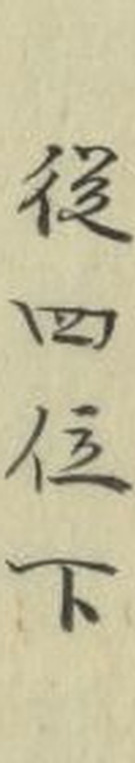従四位下
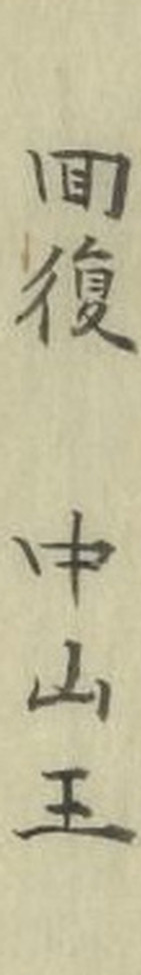回復中山王
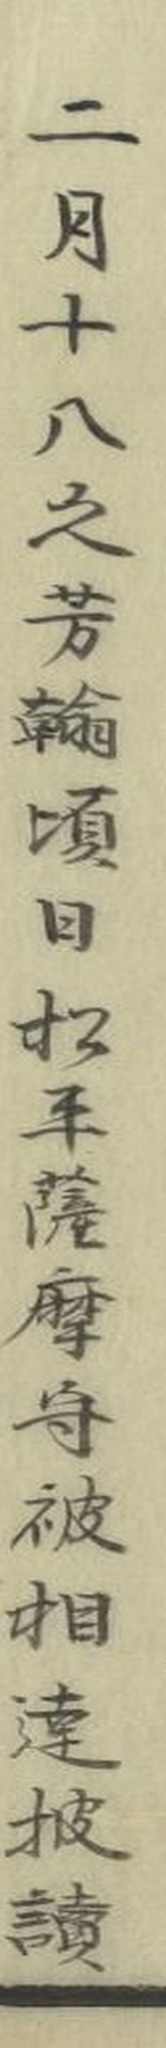二月十八日之芳翰頃日松平薩摩守被相達披読
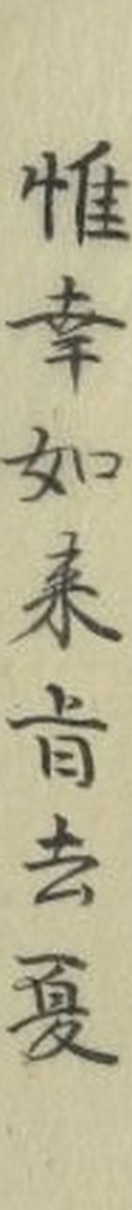惟幸如来旨去夏

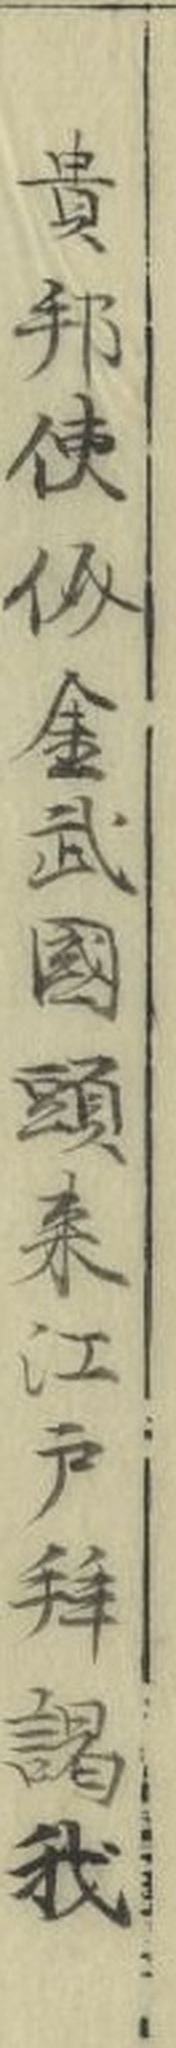貴邦使价金武国頭来江戸拝謁我
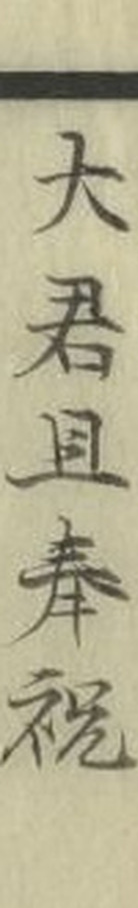大君且奉祝
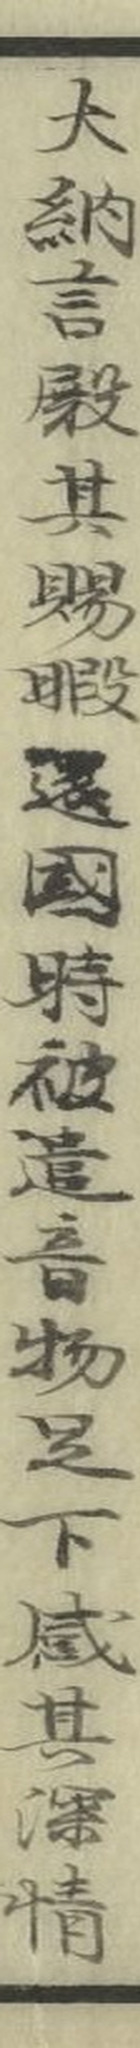大納言殿其賜暇還国時被遣音物足下感其深情
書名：琉球往来（上）
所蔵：University of the Ryukyus Library
